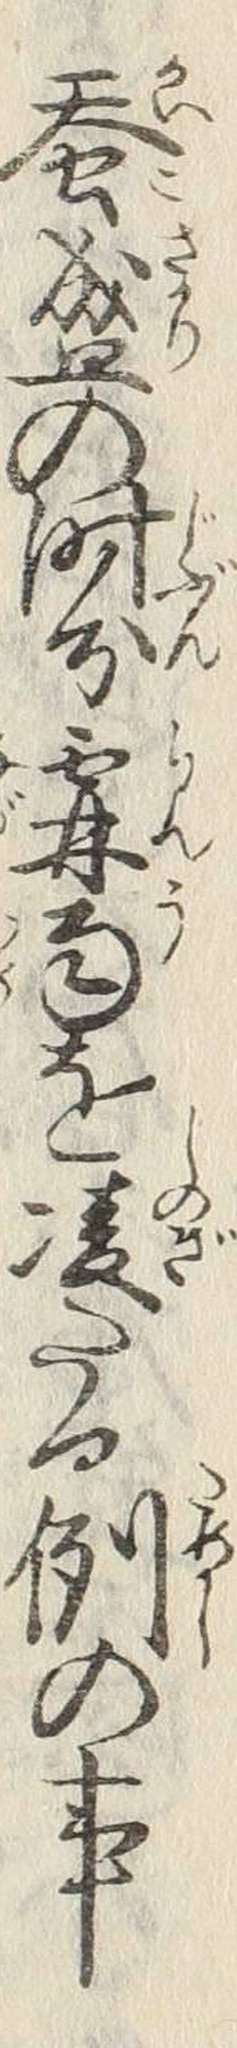蚕盛の時分霖雨を凌たる例の事
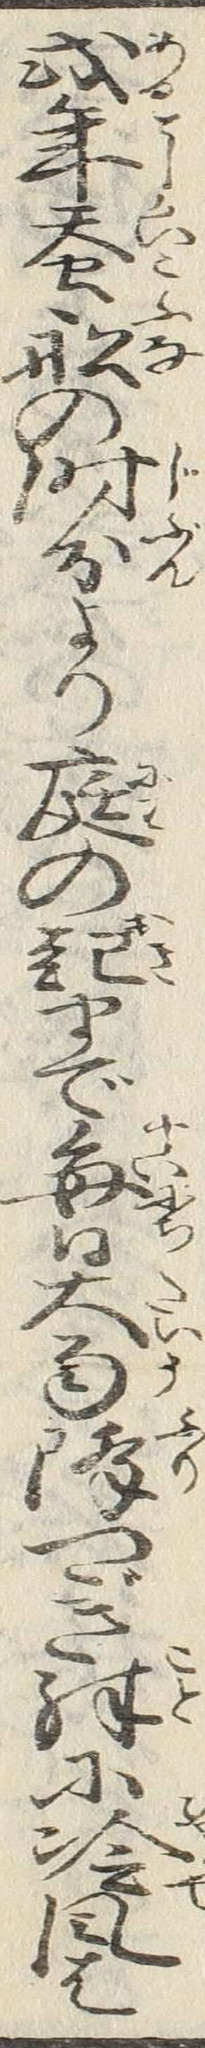或年蚕舩の時分より庭の起まで毎日大雨降つゞき殊に冷風は
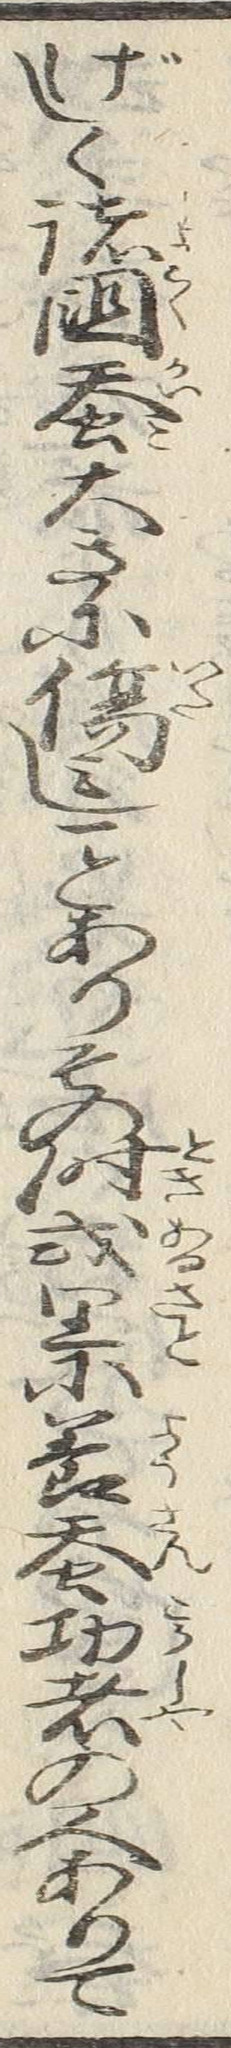げしく諸国蚕大きに傷みしことありその時或里に養蚕功者の人ありて
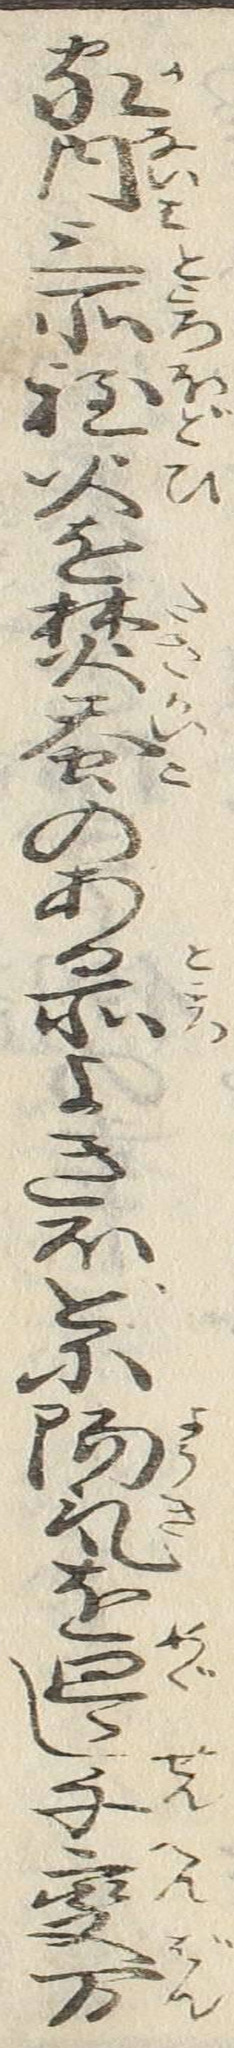家内三所程火を焚蚕のある所よきほどに陽気を廻らし千變万
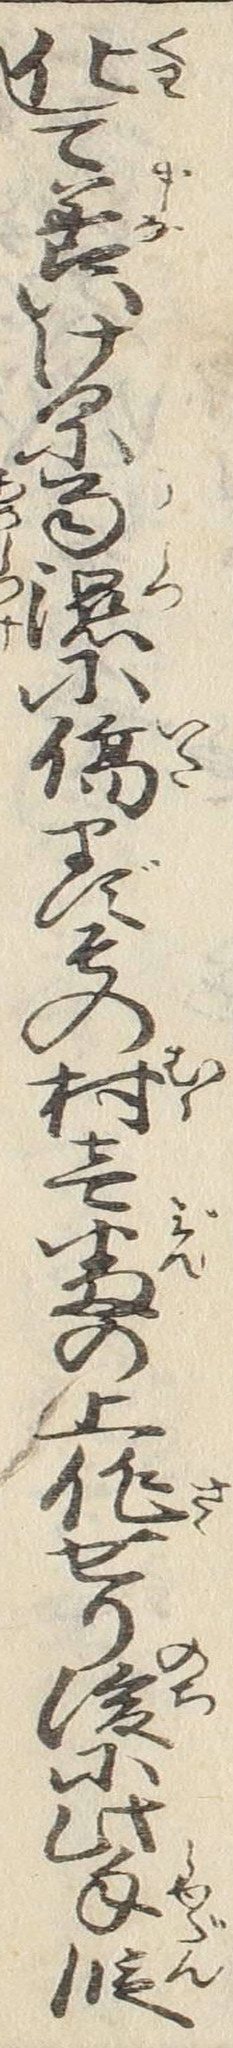化して養いけるに雨湿に傷まずその村壱番の上作せり後に此手段

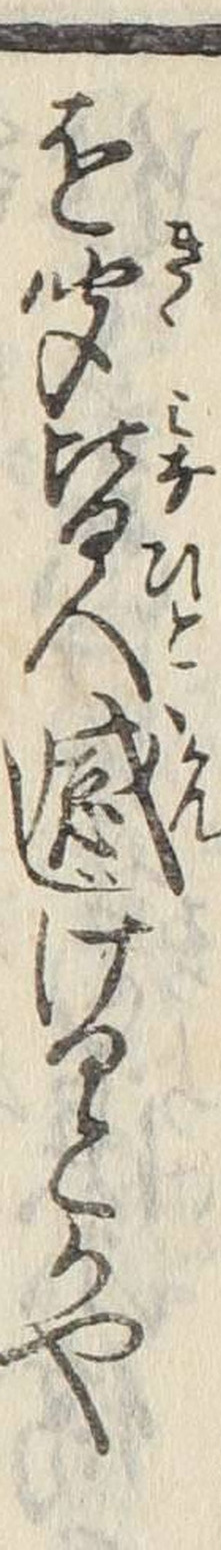を聞皆人感じけるとかや
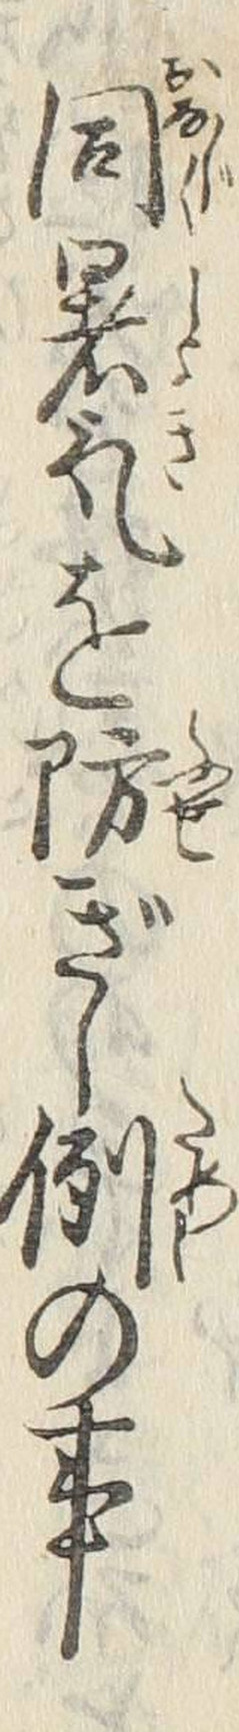同暑気を防ぎし例の事
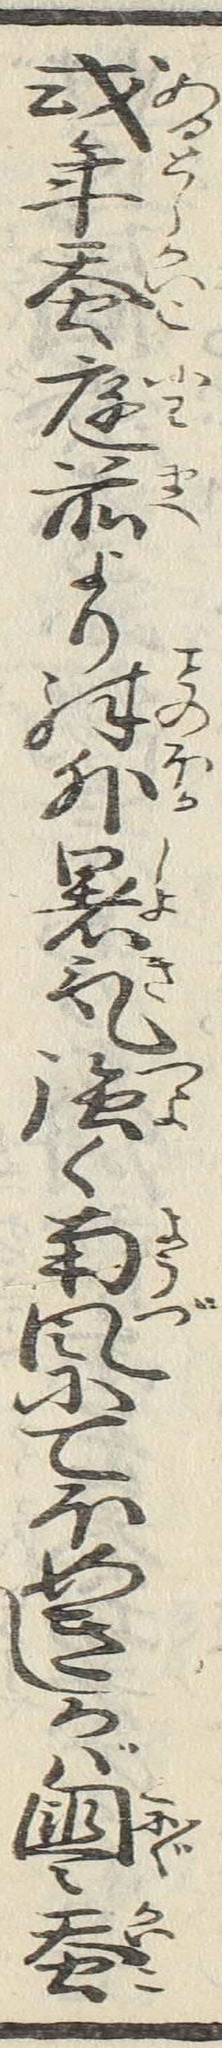或年蚕庭前より殊外暑気強く南風にてほめきしかば国々蚕
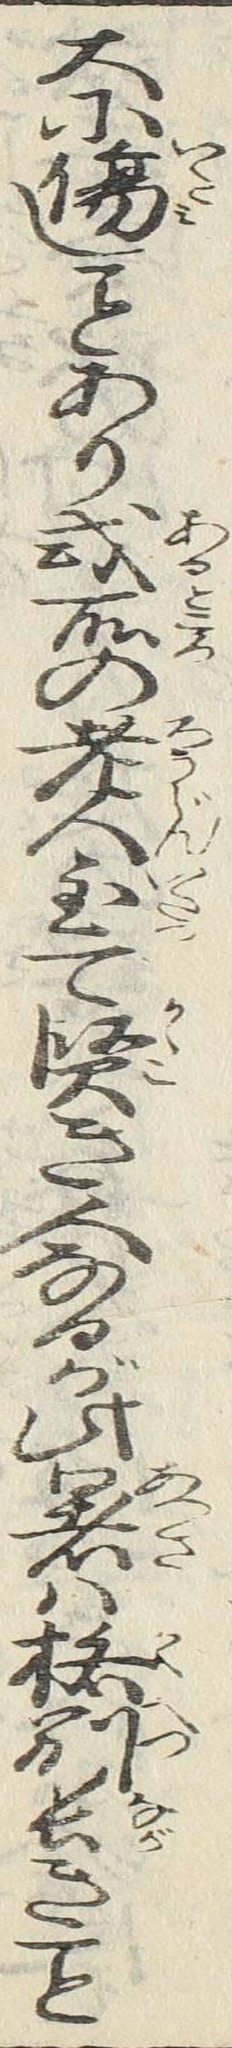大に傷しことあり或所の老人至て賢き人なるが此暑は格別長きこと
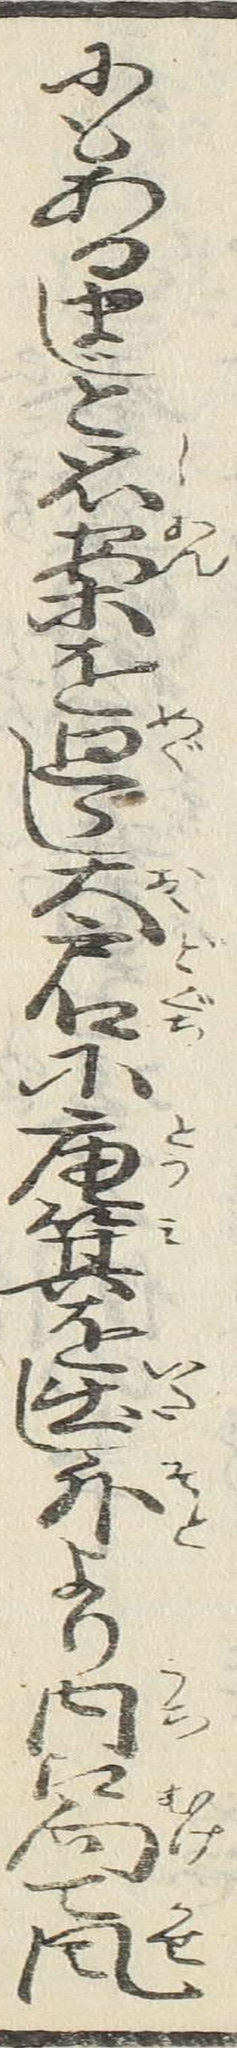にもあるまじと思案を廻らし大戸口に唐箕を出し外より内え向て風
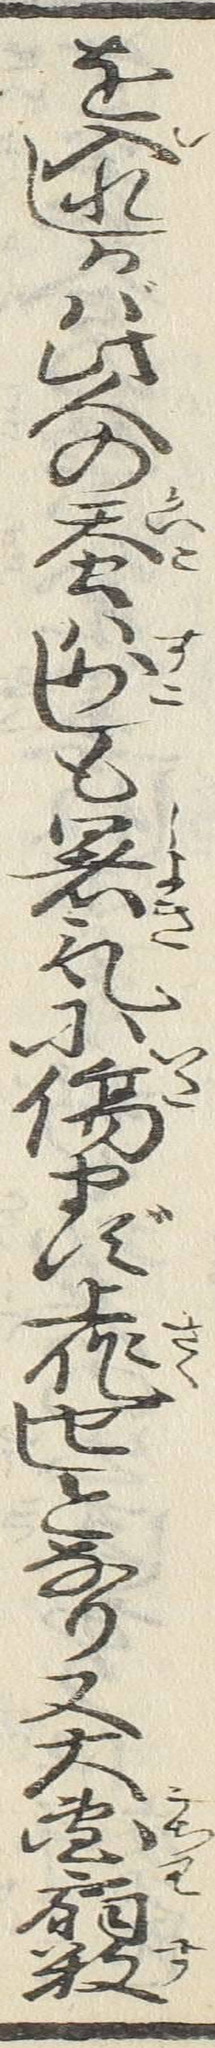を入れしかば此人の蚕は少しも暑気に傷まず上作せしとなり又大団扇数
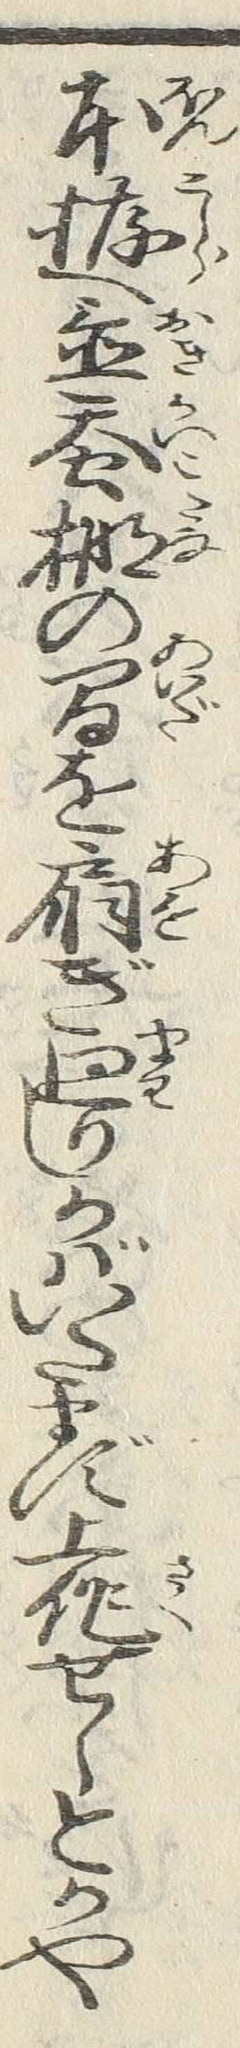本拵へ置蚕棚の間を扇ぎ廻りしかばいたまず上作せしとかや
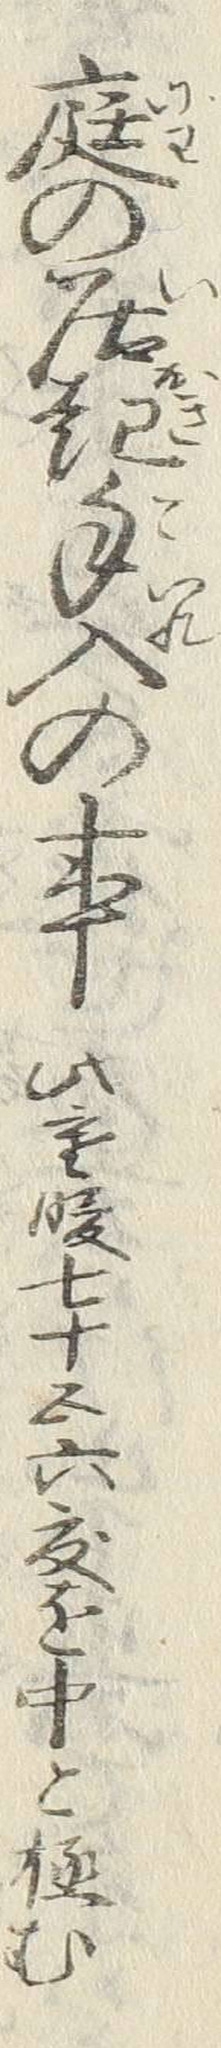庭の居起手入の事此寒暖七十五六度を中と極む
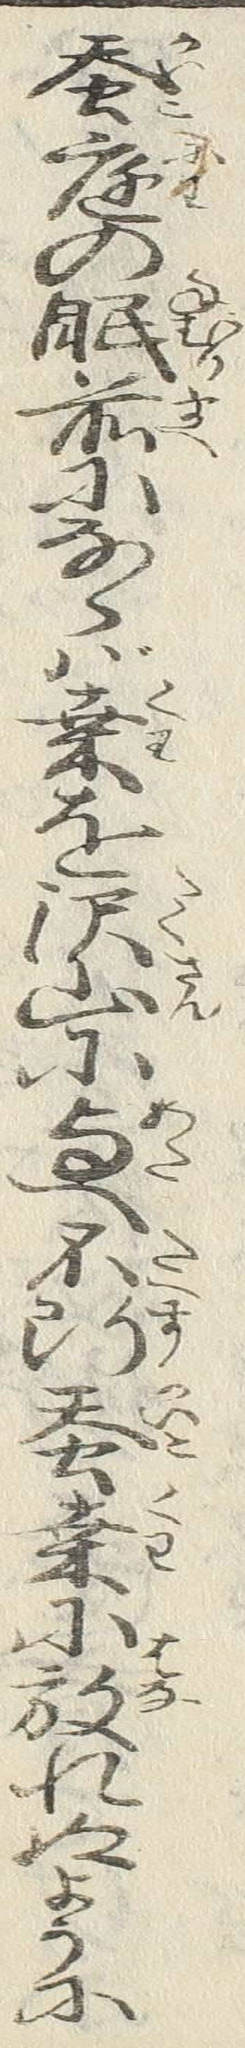蚕庭の眠前にならば桑を沢山に与へ不断蚕桑に放れぬように
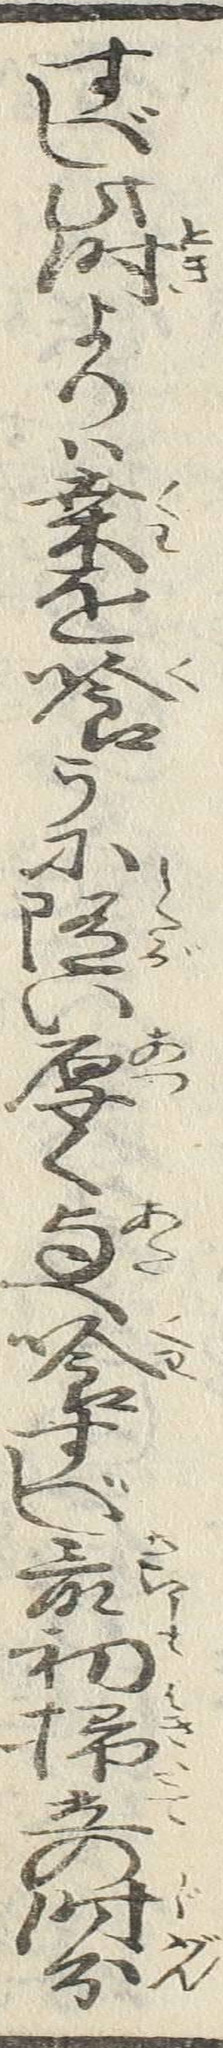すべし此時よりは桑を喰うに随い厚く与へ喰すべし最初掃立の時分
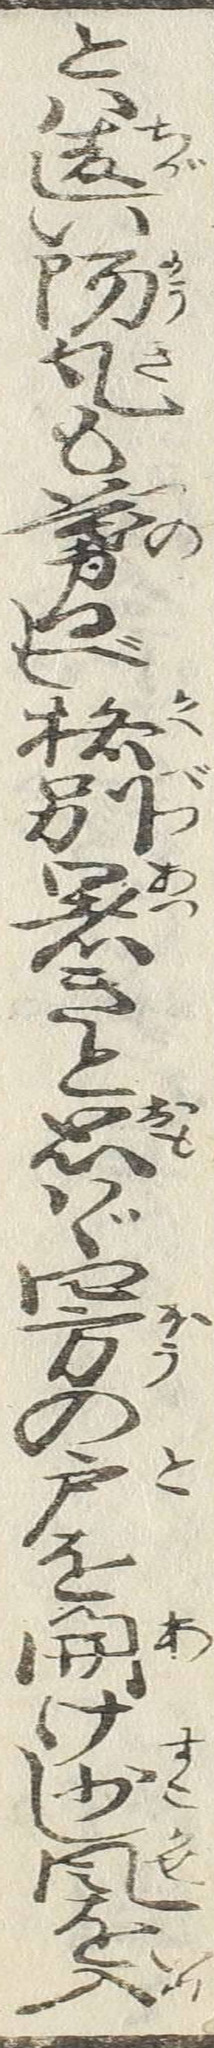とは違い陽気も募るべし格別暑きと思はゞ四方の戸を開け少し風を入
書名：養蠶實驗録
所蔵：東京大学農学生命科学図書館 国文学研究資料館
